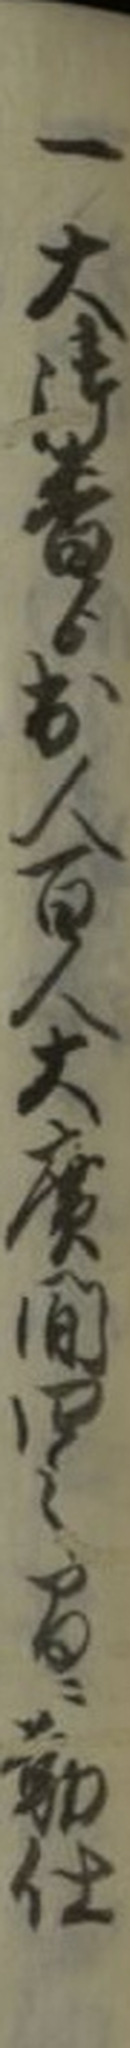一大御番ゟ出人百人大広間四之間に勤任
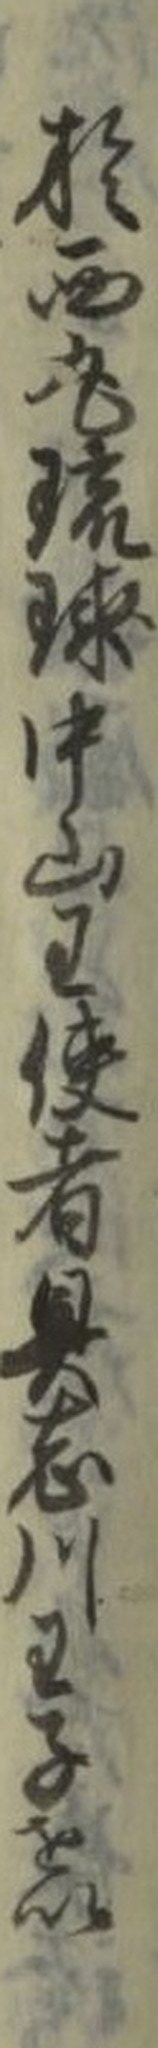於西丸琉球中山王使者具志川王子を以
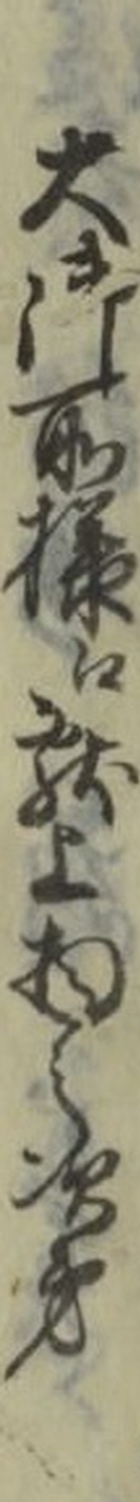大御所様え献上物之次第
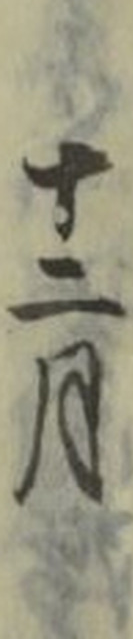十二月
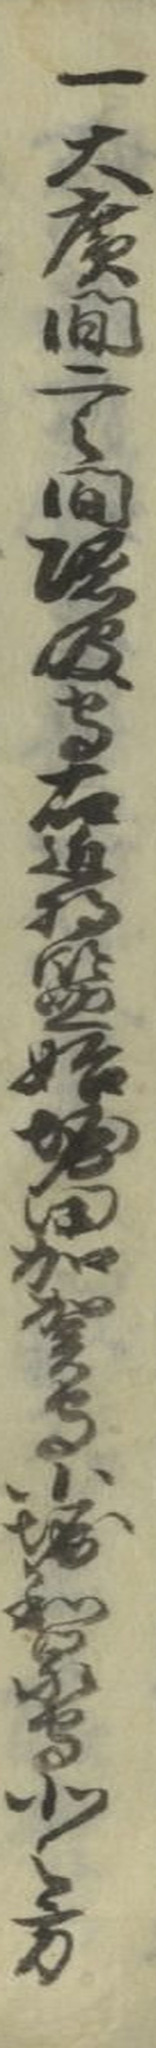一大広間二之間隠岐守右近将監始堀田加賀守小堀和泉守北之方
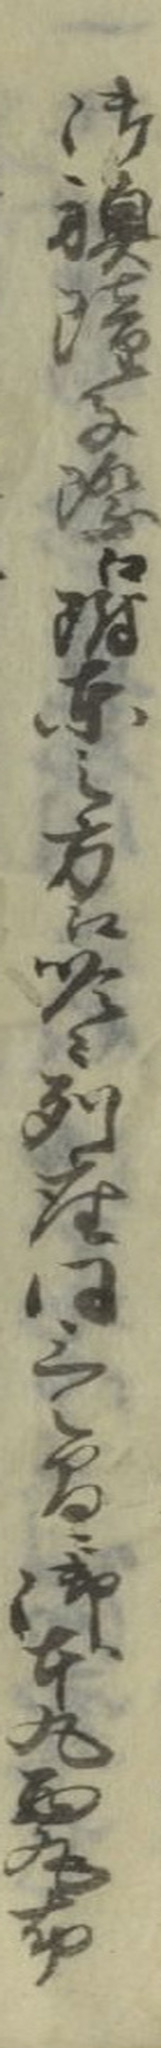御襖障子際え附東之方え順々列座同三之間に御本丸西丸布
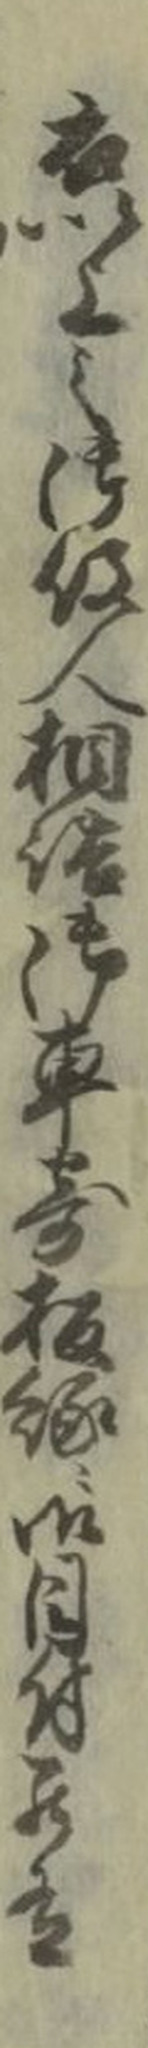衣以上之御役人相詰御車寄板縁に御目付罷有
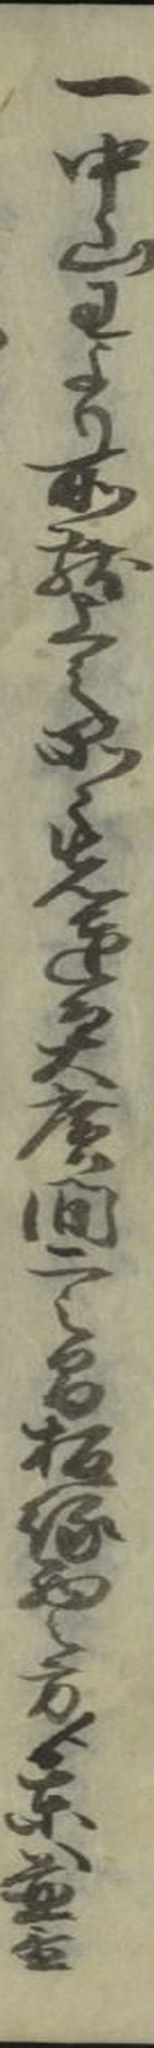一中山王より所献上之品々先達而大広間二之間板縁西之方ゟ東へ並置
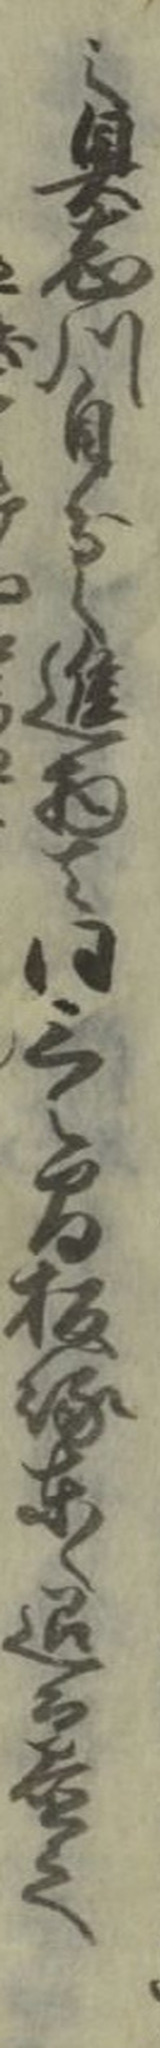之具志川自分之進物は同三之間板縁東へ退而置之
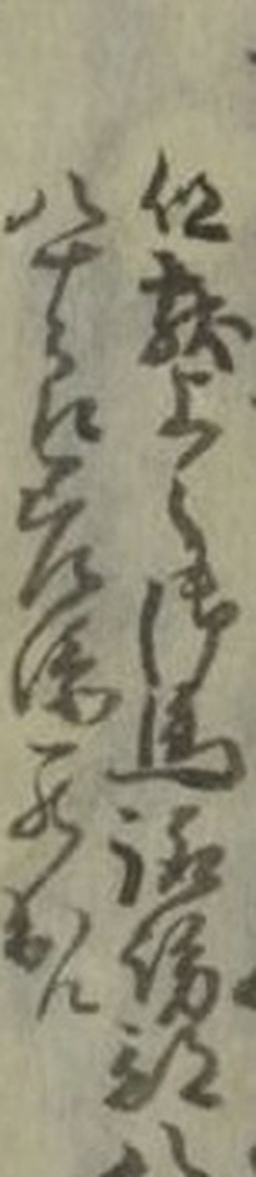八十郎差添罷出候
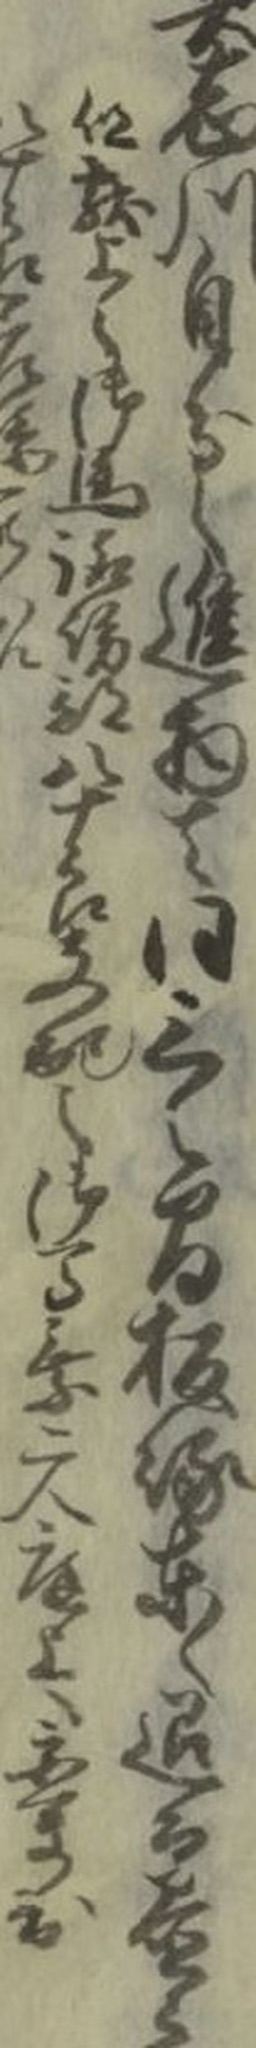但献上之御馬諏訪部八十郎支配之御馬乗二人庭上へ牽出
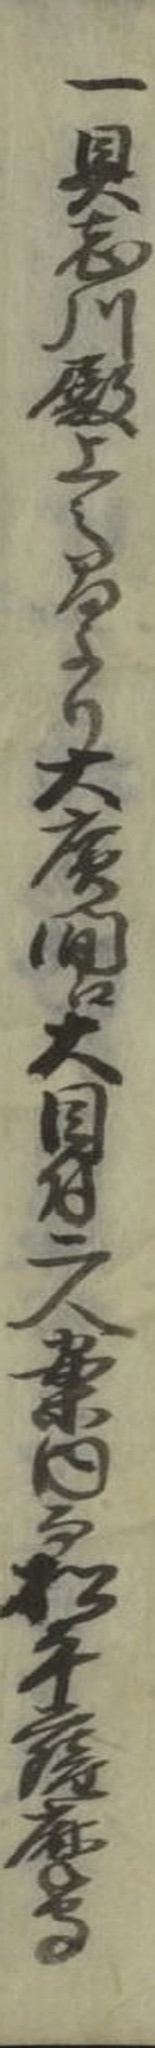一具志川殿上之間より大広間え大目付二人案内而松平薩摩守
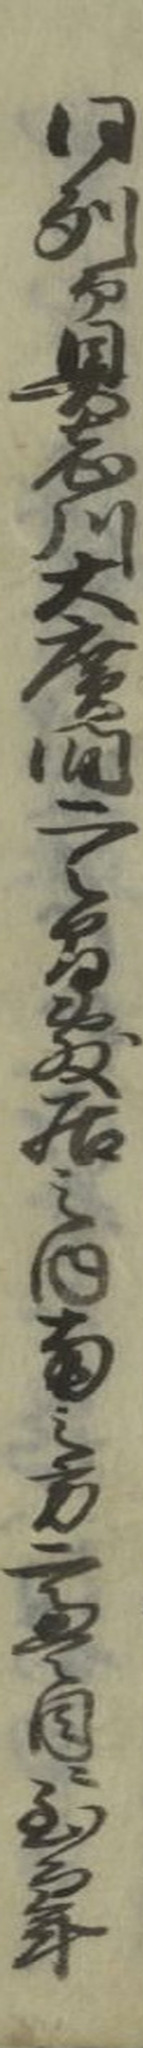同列而具志川大広間二之間敷居之内南之方二畳目に至而年

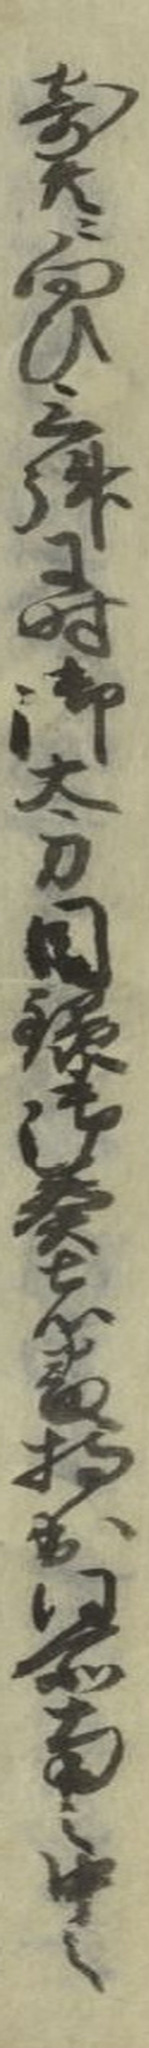寄共に向ひ三拝于時御太刀目録御奏者番持出同所南之中之
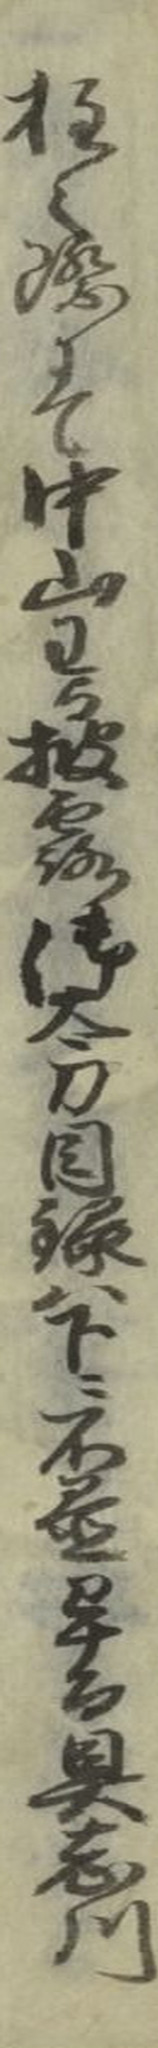柱之際にて中山王ゟ披露御太刀目録は下に不置畢而具志川
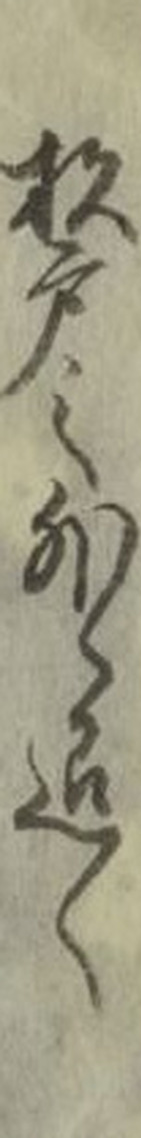板戸之外へ退く
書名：琉球人来朝之記
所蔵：University of the Ryukyus Library
